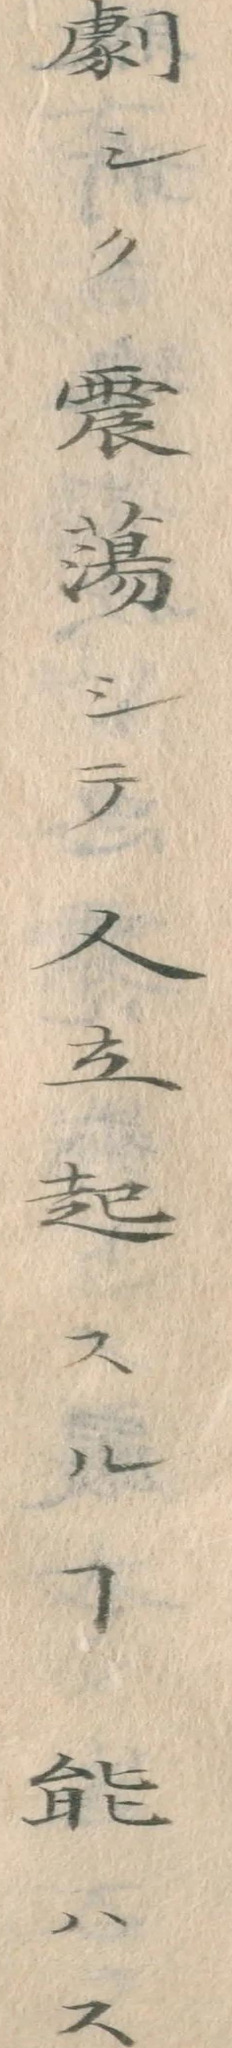劇シク震蕩シテ人立起スル事能ハス
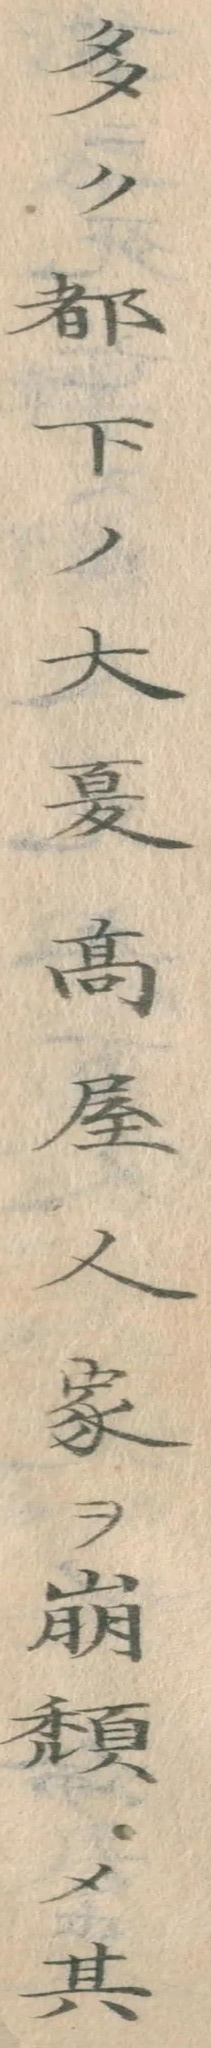多ク都下ノ大髙屋人家ヲ崩頽メ其

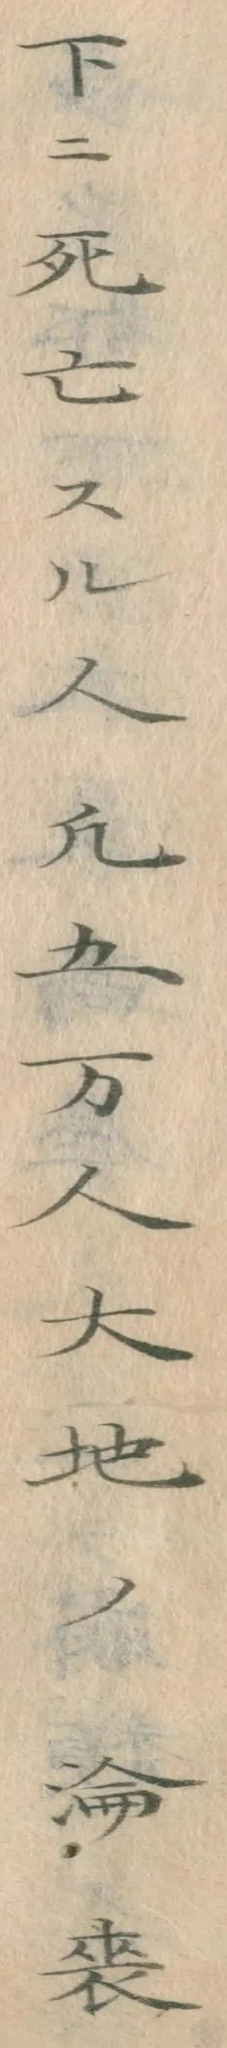下ニ死亡スル人凡五万人大地ノ淪
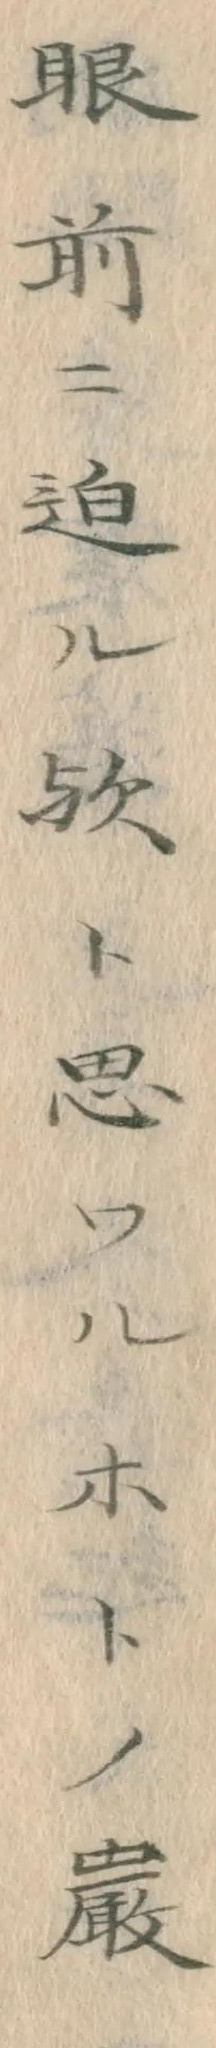眼前ニ迫ル歟ト思ワルホトノ厳シ
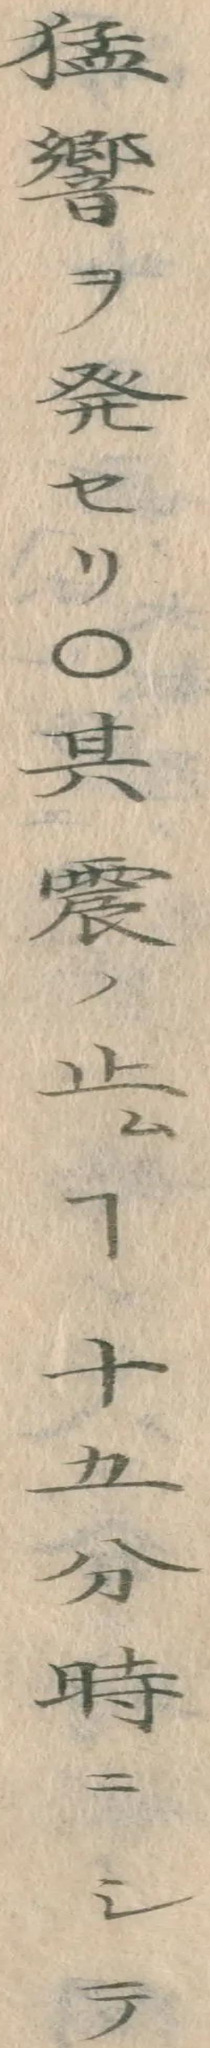猛響ヲ発セリ○其震ノ止ム事十五分時ニシテ
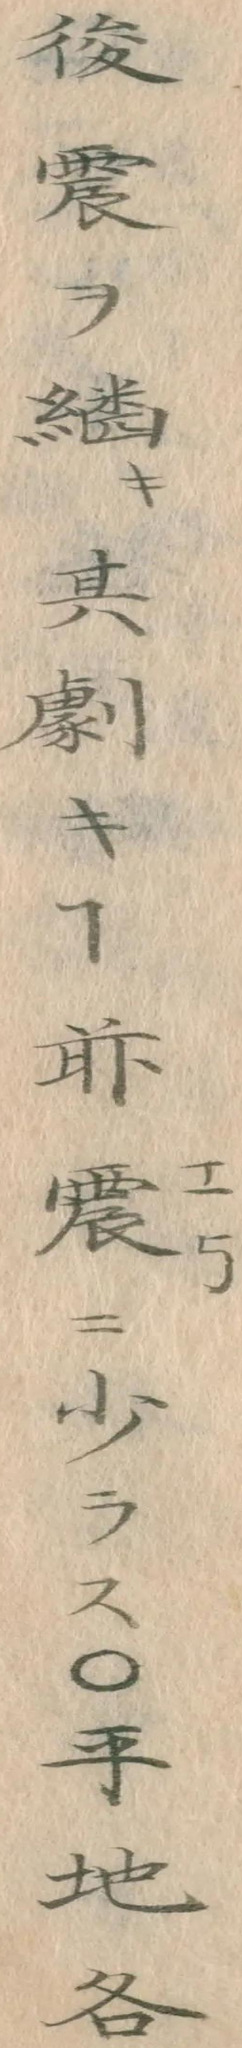後震ヲキ其劇キ事前震ニ少ラス○平地各
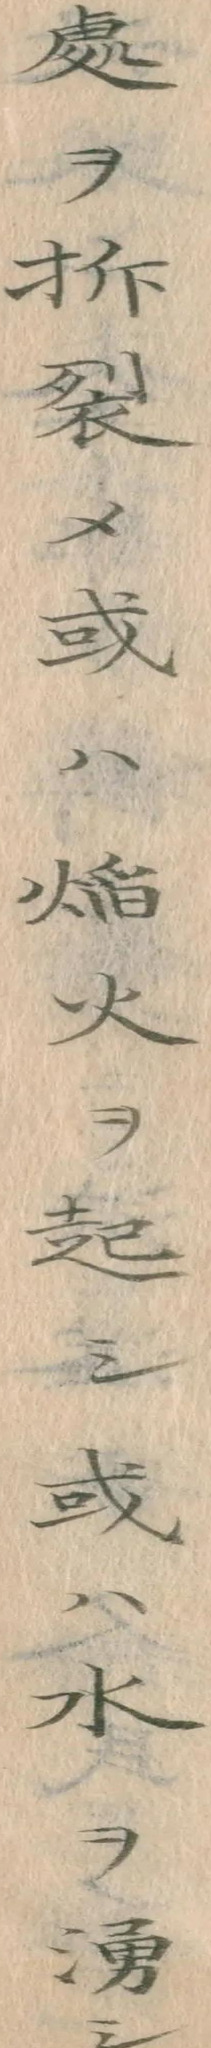処ヲ拆裂メ或ハ焔火ヲ起シ或ハ水ヲ湧シ
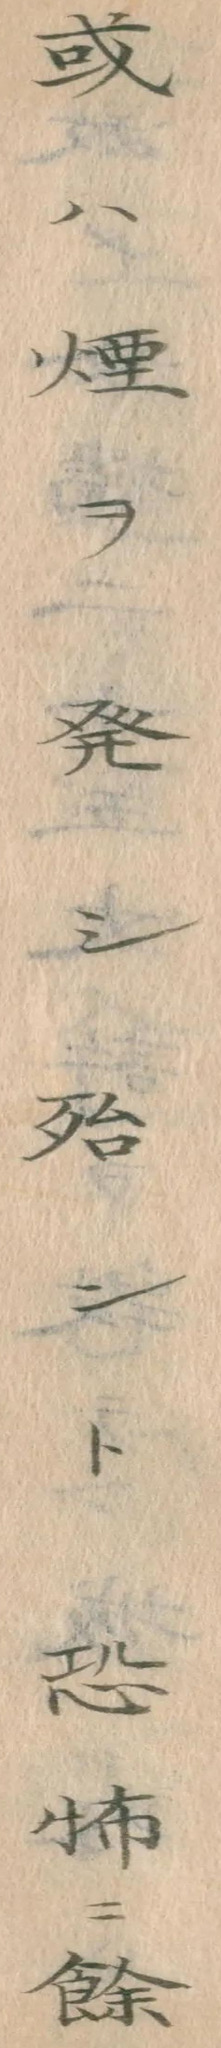或ハ煙ヲ発シ殆ント恐怖ニ余
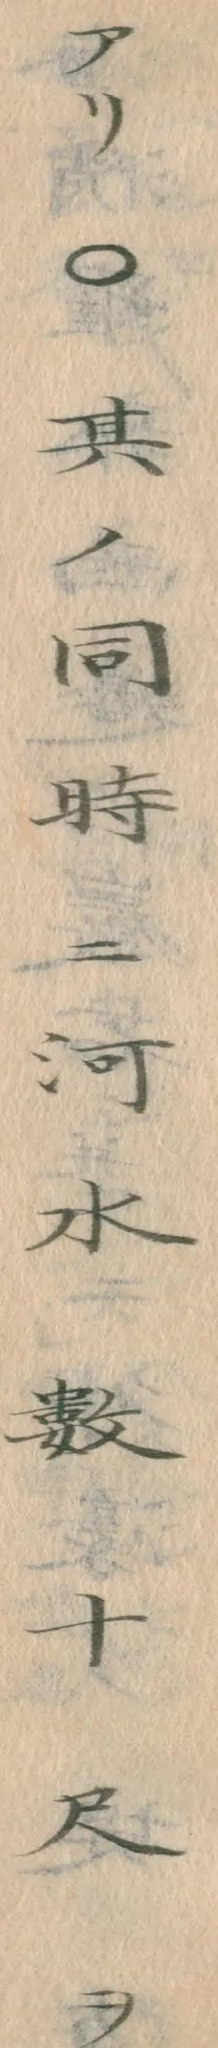アリ○其ノ同時ニ河水数十尺ヲ
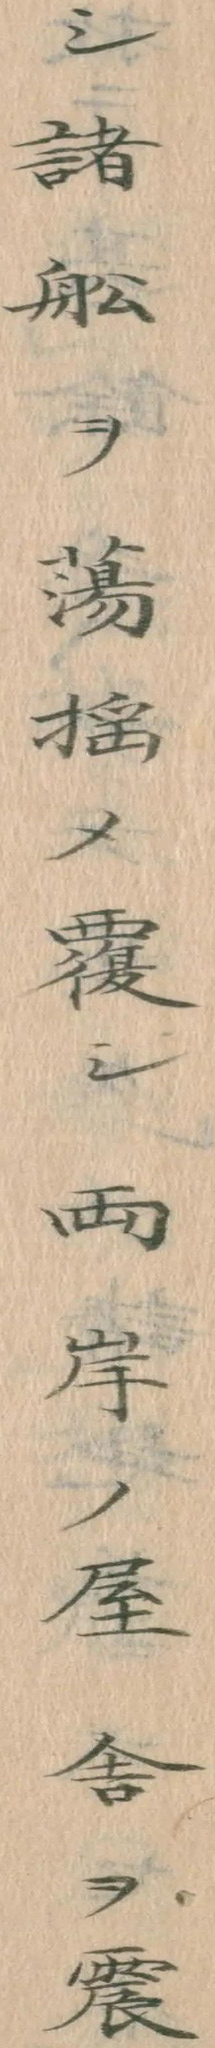シ諸船ヲ蕩揺メ覆シ両岸ノ屋舎ヲ震
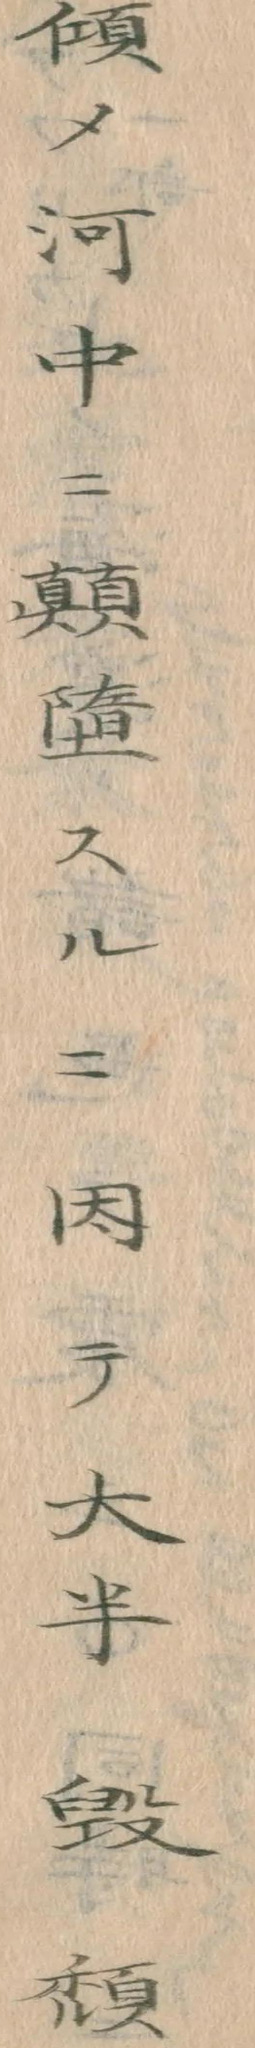傾メ河中ニ顛堕スルニ因テ大半毀頽
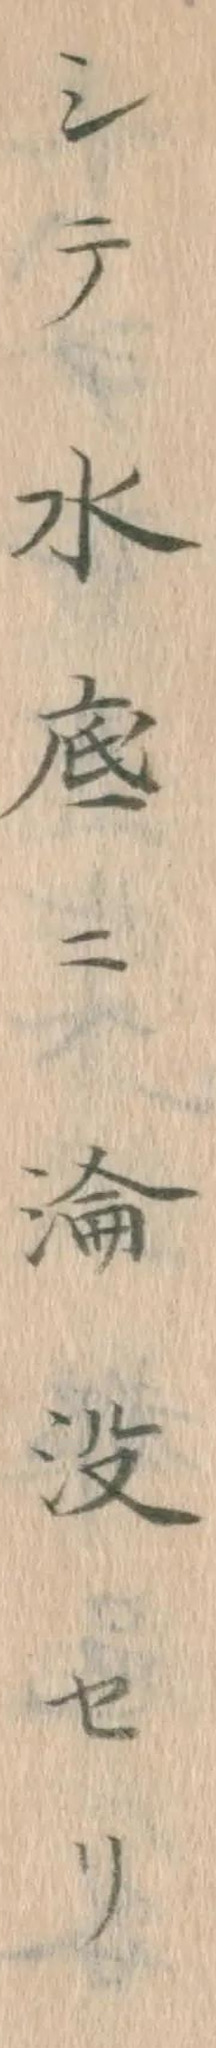シテ水底に淪没セリ
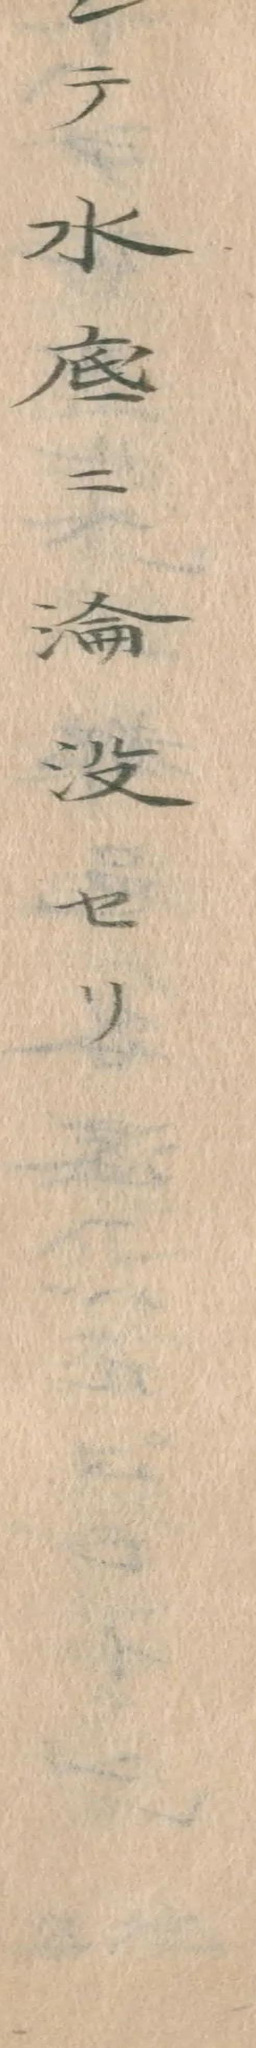シテ水底に淪没セリ
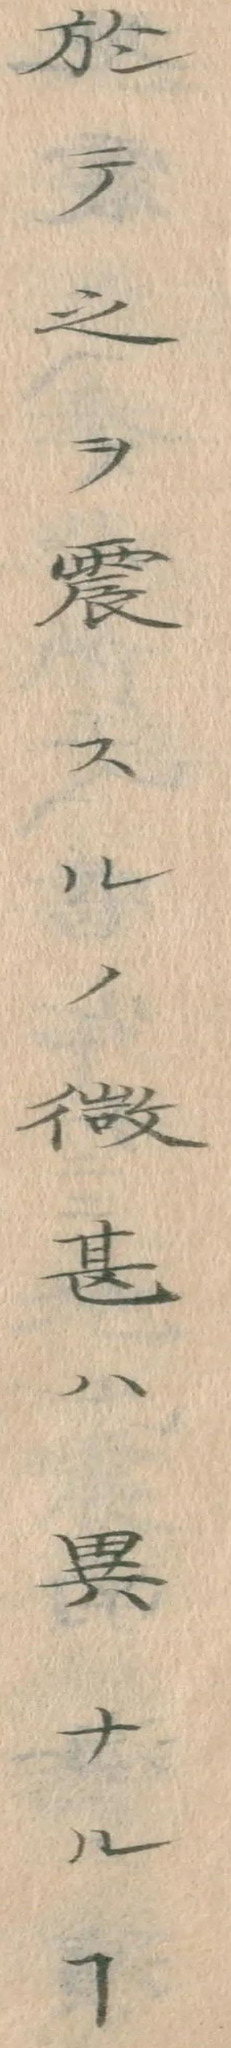於テ之ヲ震スルノ微甚ハ異ナル事
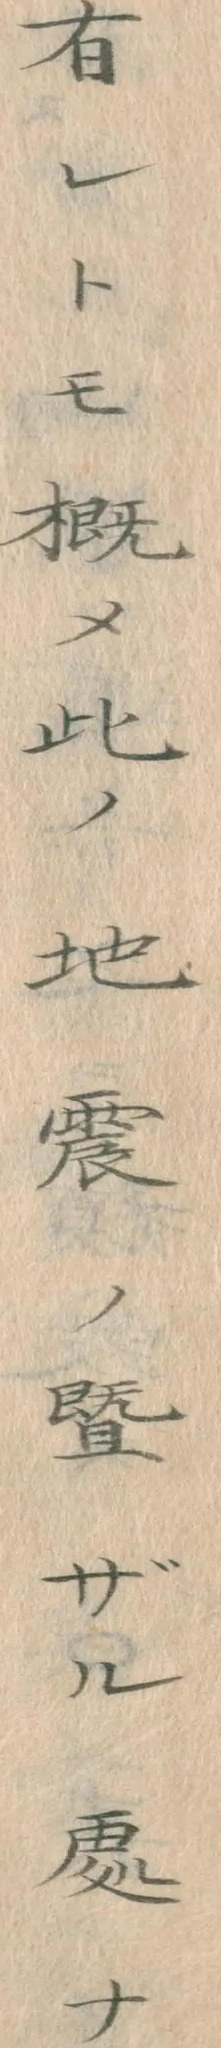有レトモ概メ此ノ地震ノ曁ザル処ナ
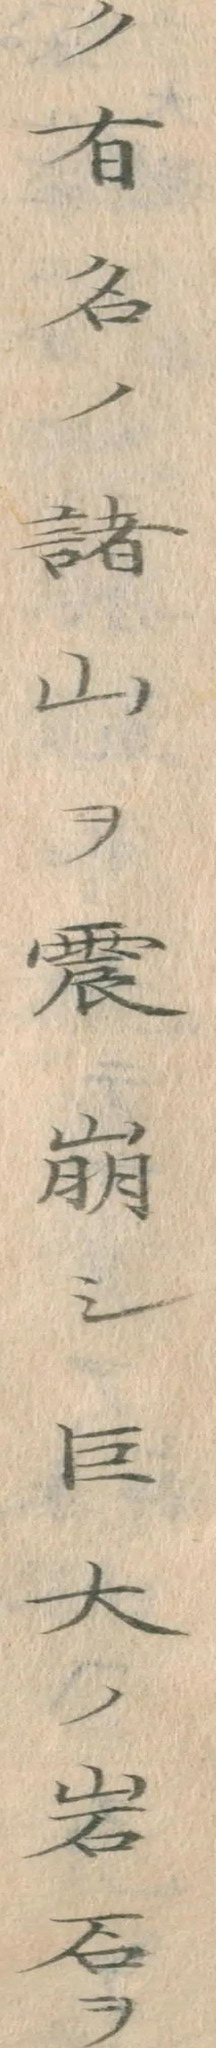ク有名ノ諸山ヲ震崩シ巨大ノ岩石ヲ
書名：輪池叢書. 12
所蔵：国立国会図書館 National Diet Library, JAPAN
